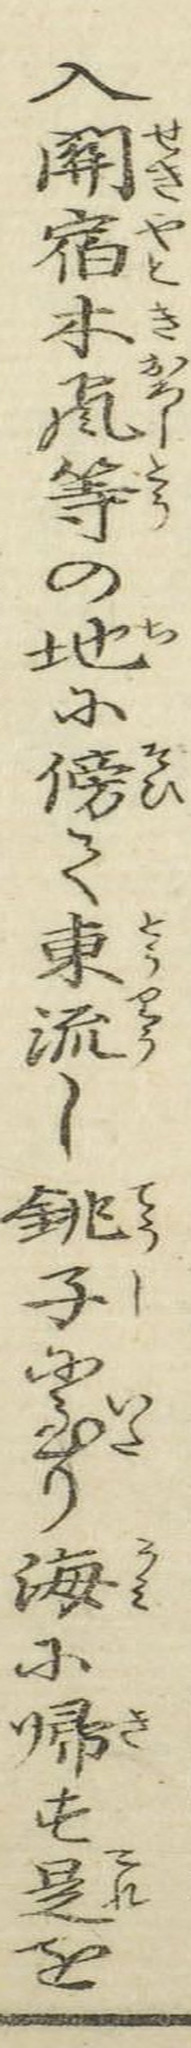入関宿木颪等の地に傍て東流し銚子に至り海に帰す是を
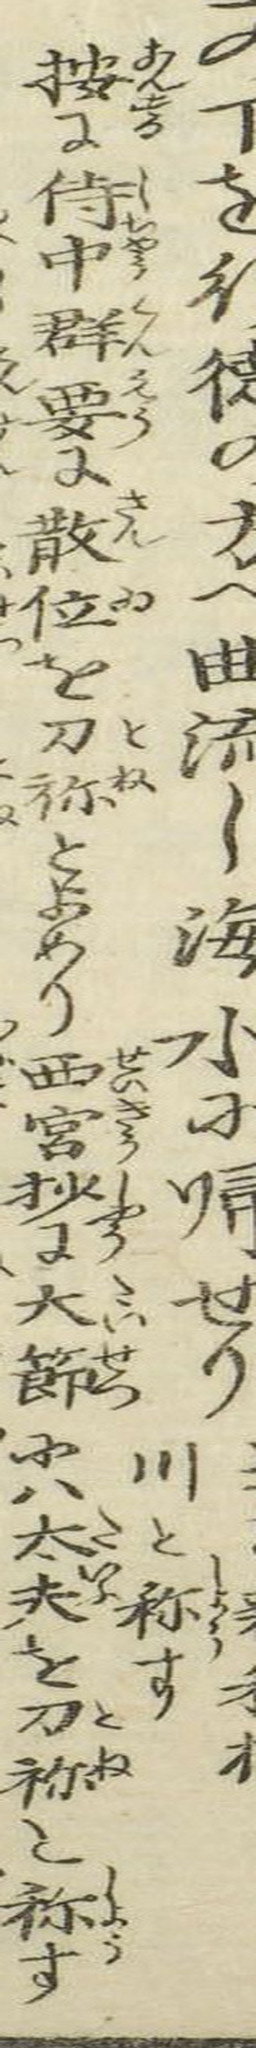按に侍中郡要に散位を刀祢とよめり西宮抄に大節には太夫を刀祢と称す
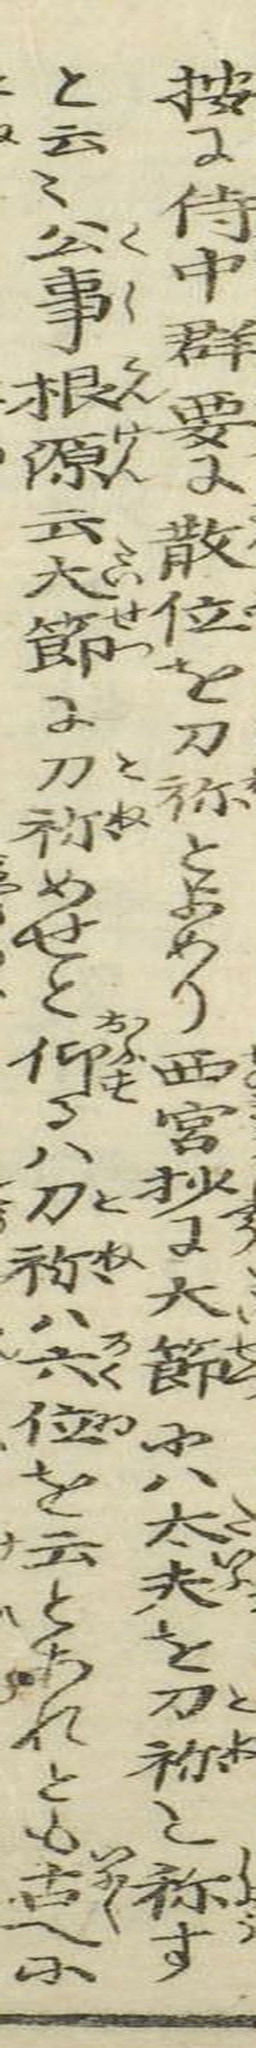と云々公事根源云大節に刀祢めせと仰るは刀祢は六位を云とあれとも古へに
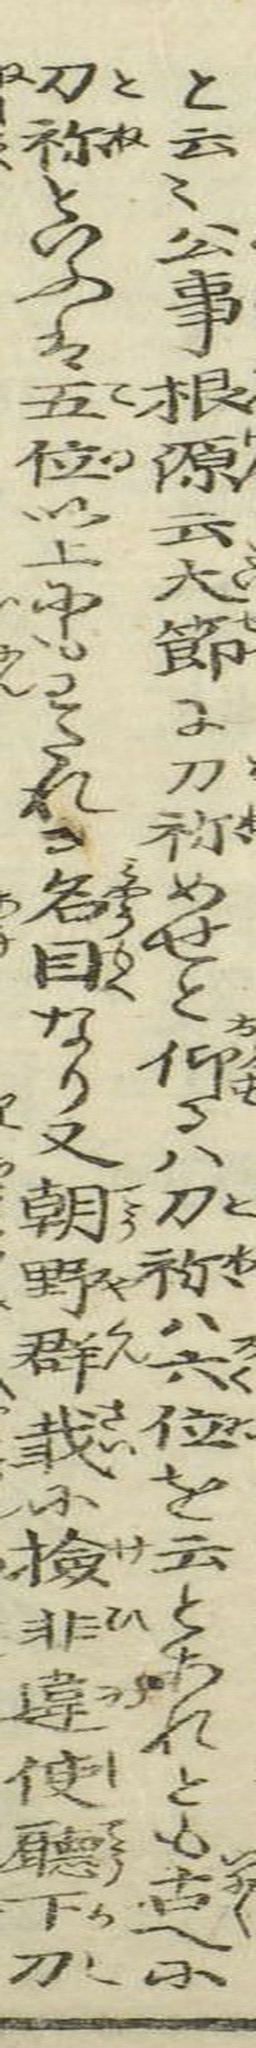刀祢といふは五位以上にもわたれる名目なり又朝野群載に検非違使庁下刀
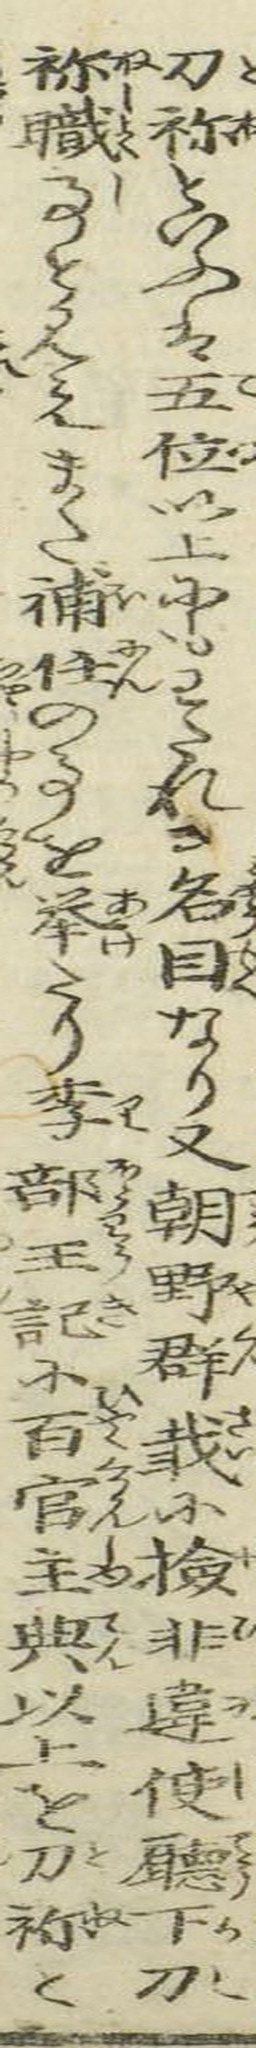祢職事と見えまた補任の事を挙たり李部王記に百官主典以上を刀祢と
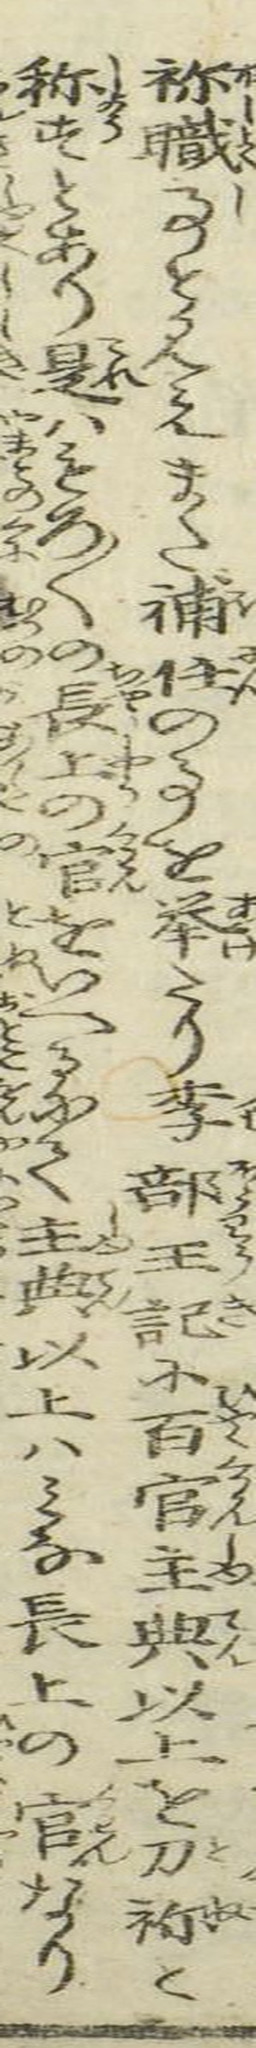称すとあり是はもろ〳〵の長上の官をいへるにて主典以上はみな長上の官なり
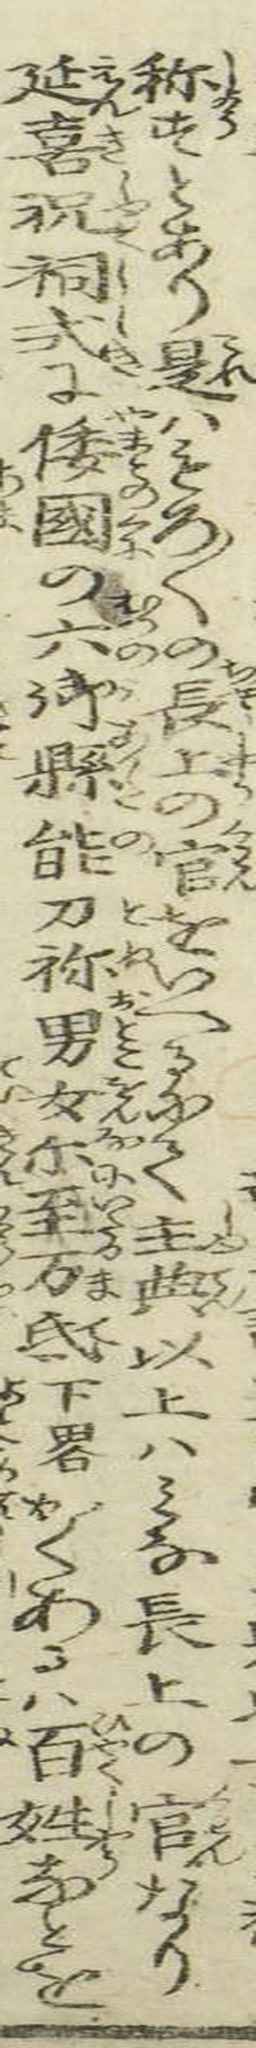延喜祝祠式倭国の六御縣能刀祢男女尓至万氐下界かくあるは百姓なとを
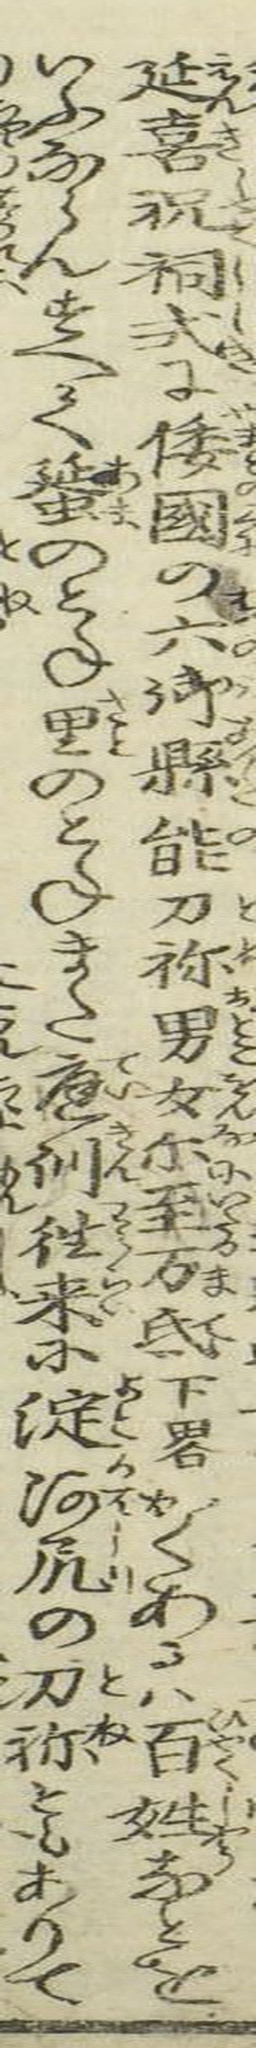いふならんすへて蜑のとね里とねまた庭訓往来に淀河尻の刀祢ともありて
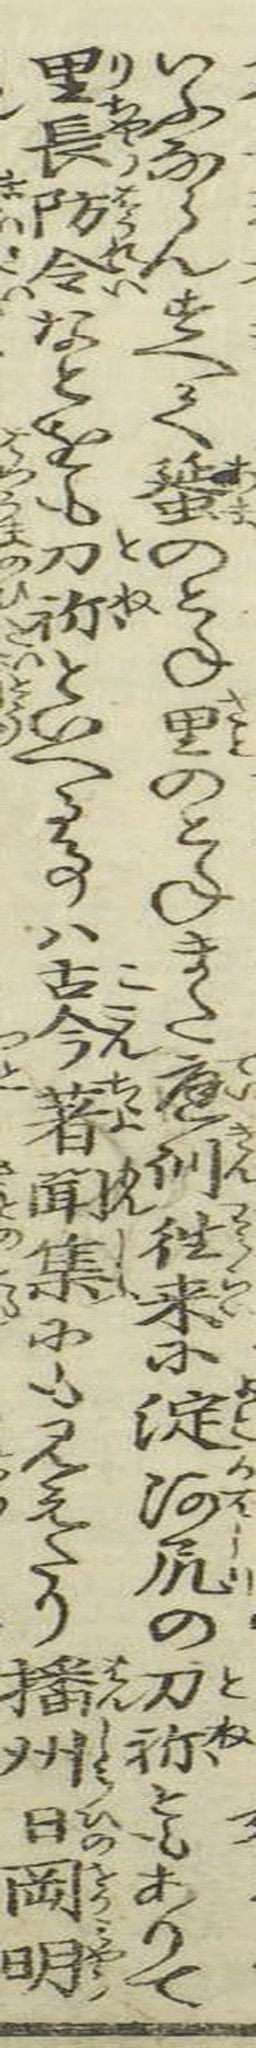里長防令なとをも刀祢といへる事は古今著聞集にも見えたり播州日岡明
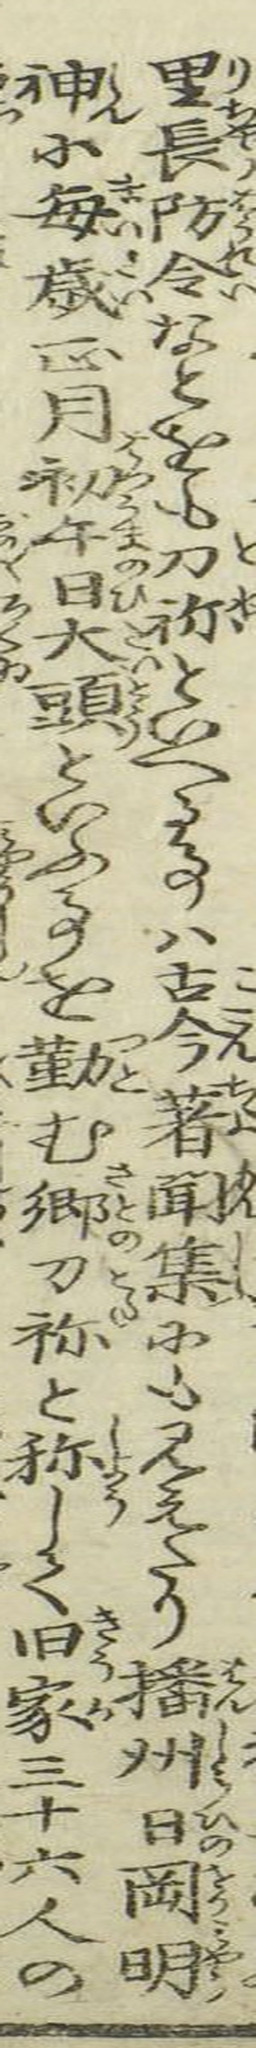神に毎歳正月初午日大頭といふ事を勤む郷刀祢と称して旧家三十六人の
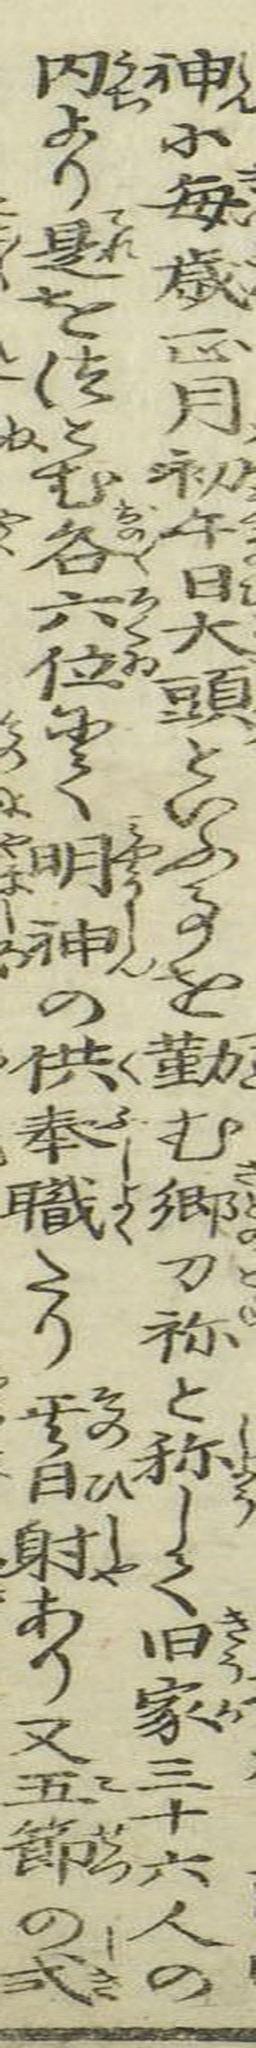内より是をつとむ各六位にて明神の供奉職たり其日射あり又五節の式
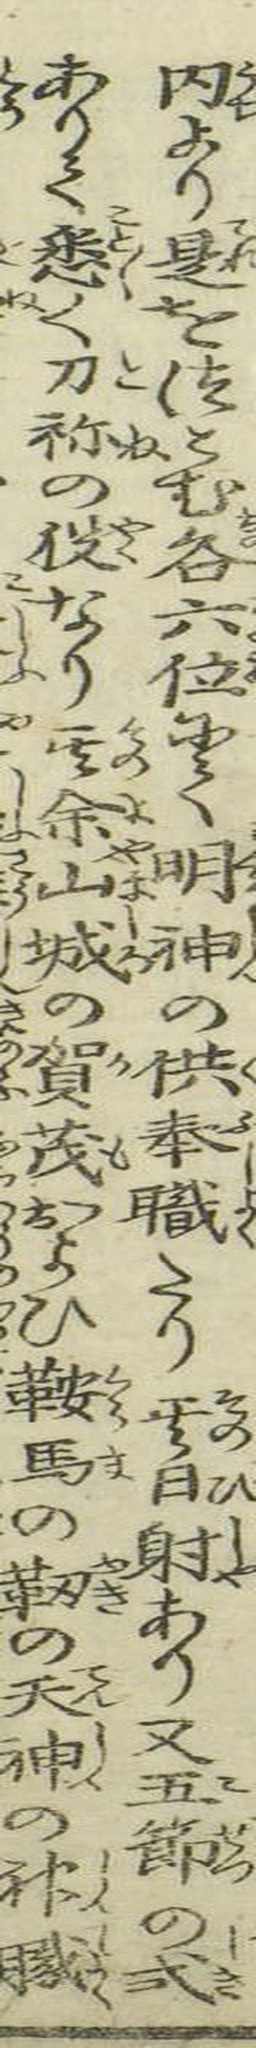ありて悉く刀祢の役なり其余山城の賀茂およひ鞍馬の靭天神の神職
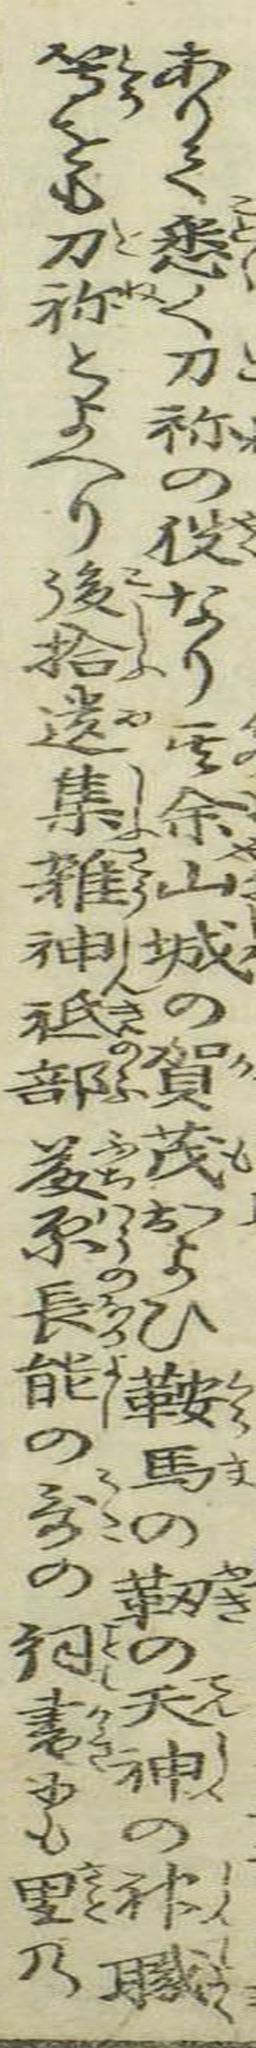等をも刀祢とよへり後拾遺集雑神祇部藤原長能の哥の詞書にも里の

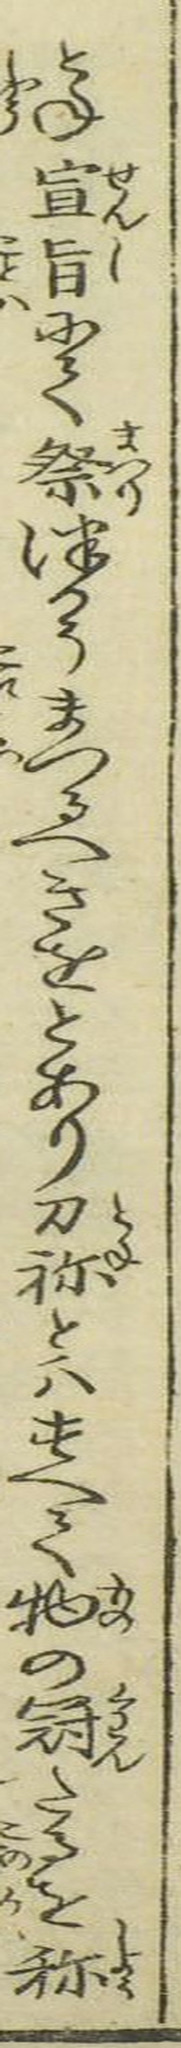とね宣旨にて祭つかうまつるへきをとあり刀祢はすへて物の冠たるを称
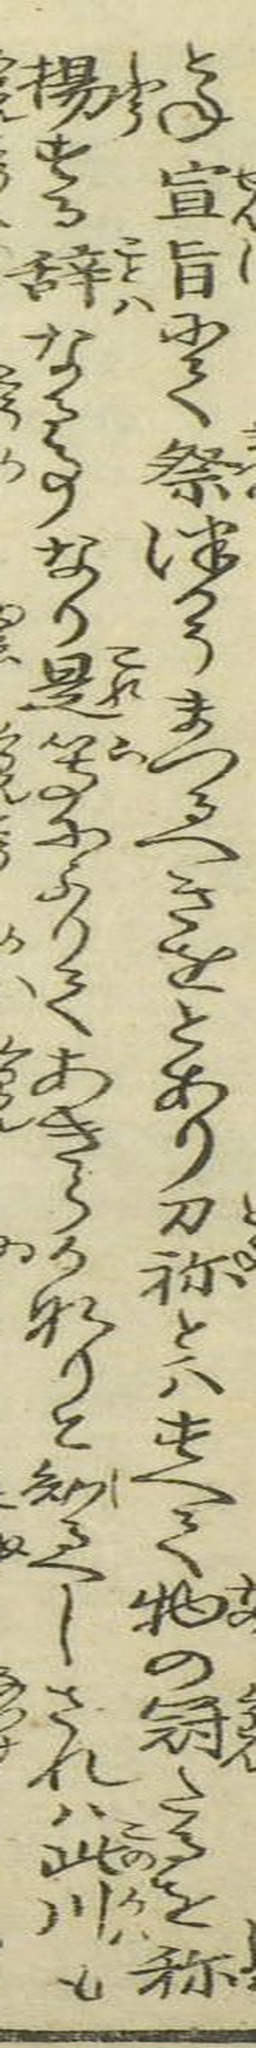揚する辞なる事なり是等によりてあきらかなりと知るへしされは此川も
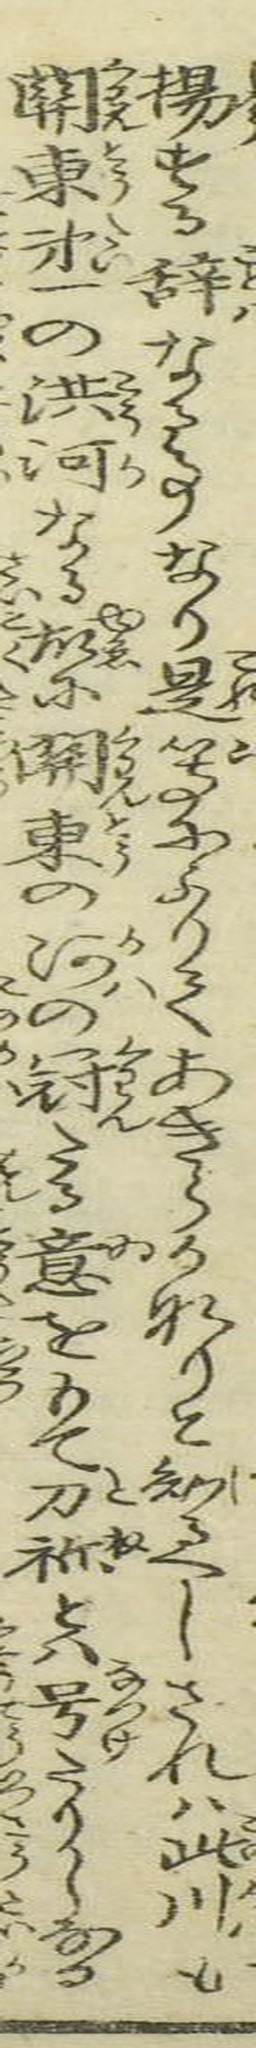関東第一の洪河なる故に関東の河の冠たる意もて刀祢とは号たりしなる
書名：江戸名所図会 20巻 巻之20
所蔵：東京学芸大学教育コンテンツアーカイブ
